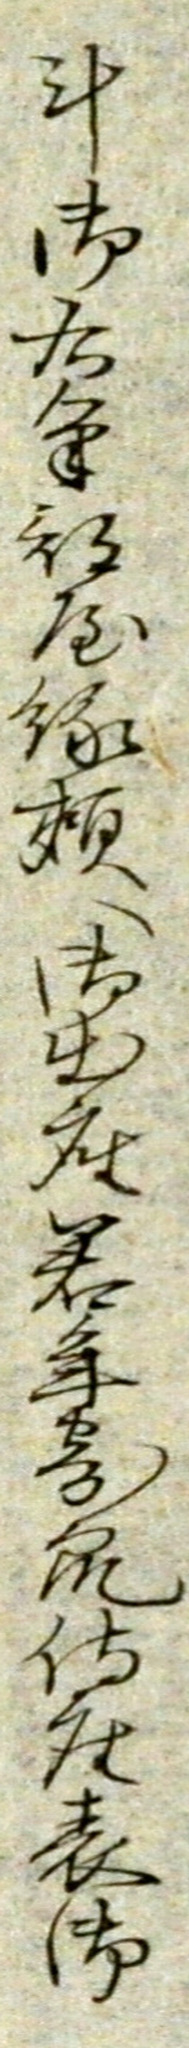殿計御右筆部屋縁頬へ御出座若年寄衆侍座表御
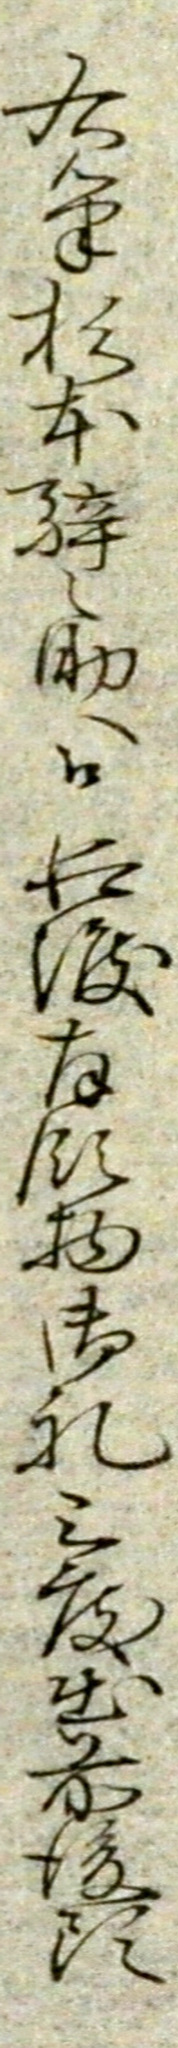右筆杉本辯之助へ被仰渡拝領物御礼三度出前後頭
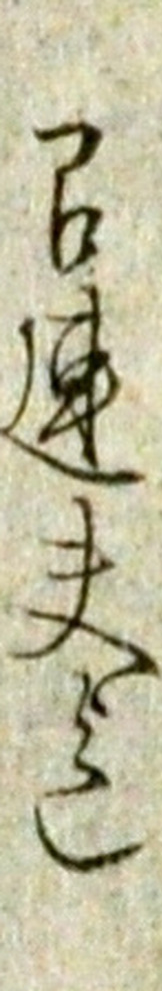召連夫迄
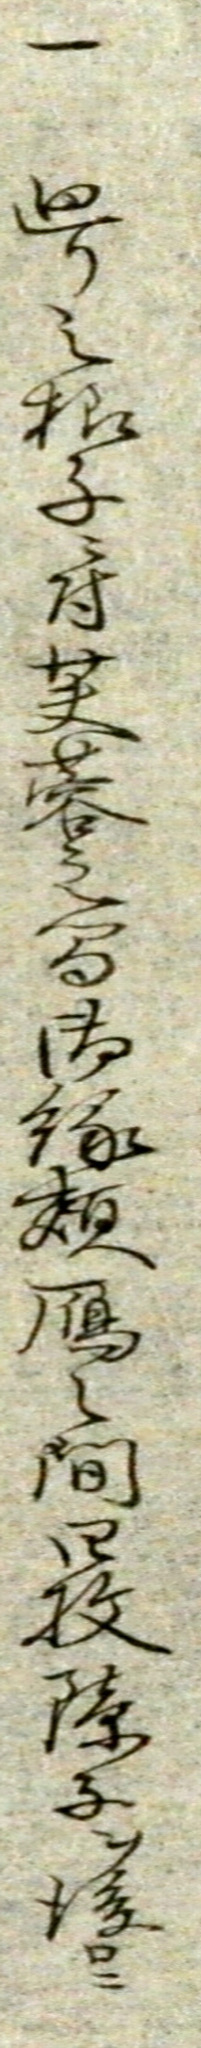一廻り之様子に付芙蓉之間御縁頬雁之間四枚障子ヲ後日ニ
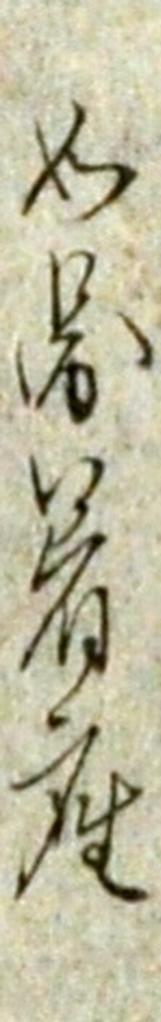如図着座
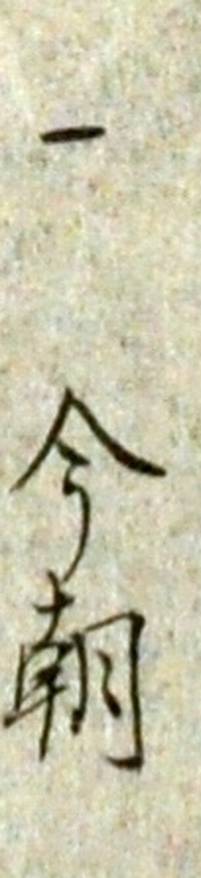一今朝
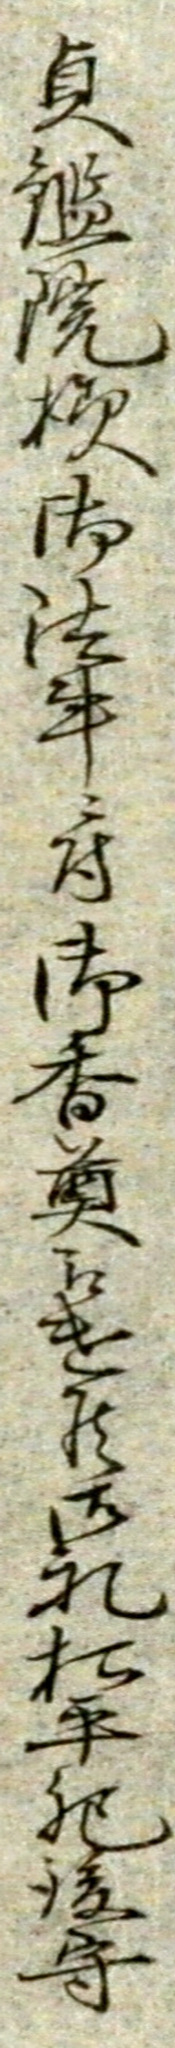貞鑑院様御法事ニ付御香奠被遣候御礼松平肥後守
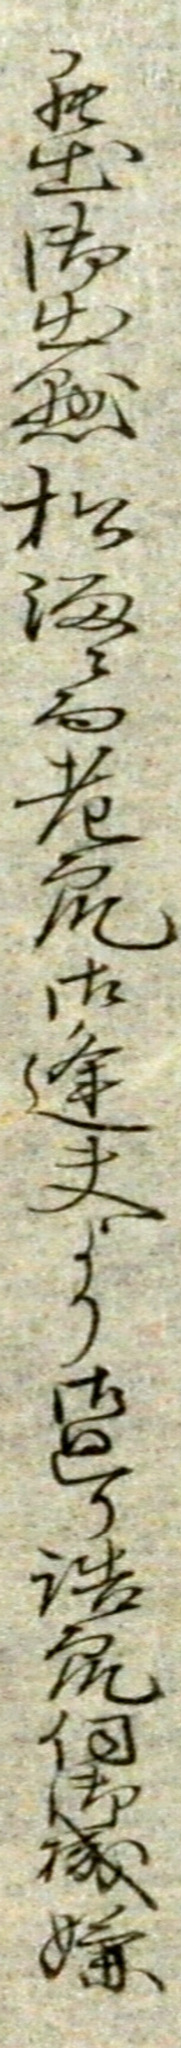罷出御出懸松坂ニ而老衆御逢夫より御廻り詰衆伺御機嫌
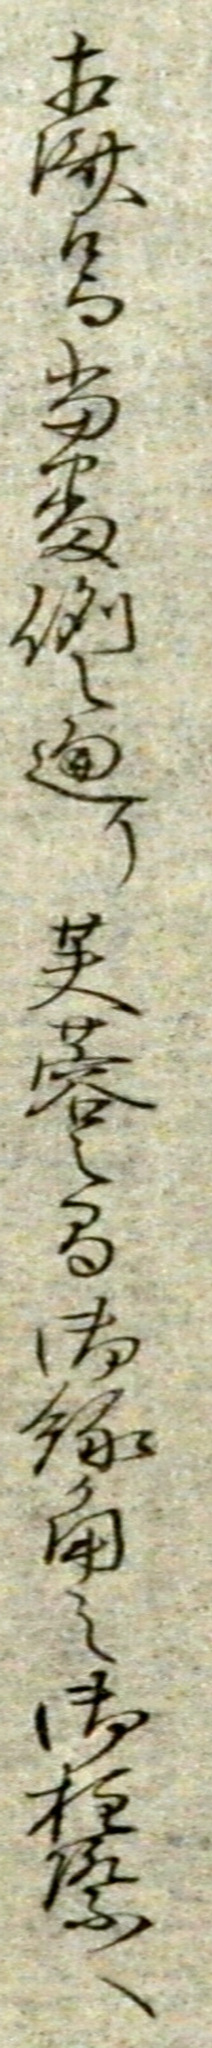相済被与当番例之通り芙蓉之間御縁角之際へ
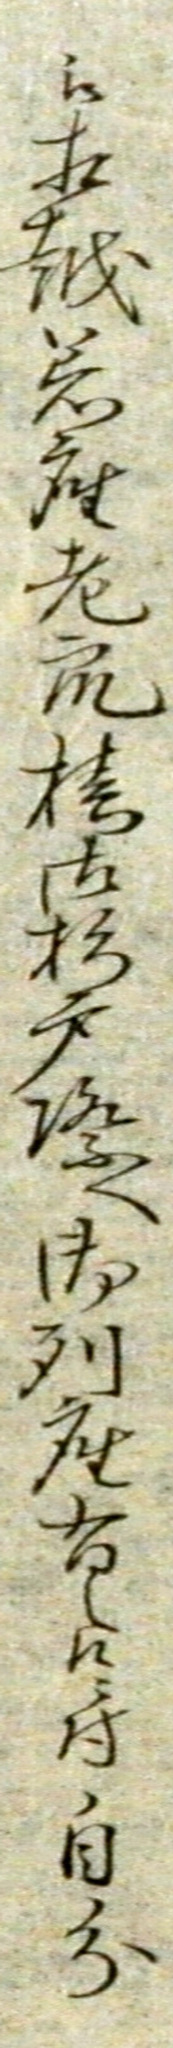被相越着座老衆御杉戸際へ御列座有之候自分
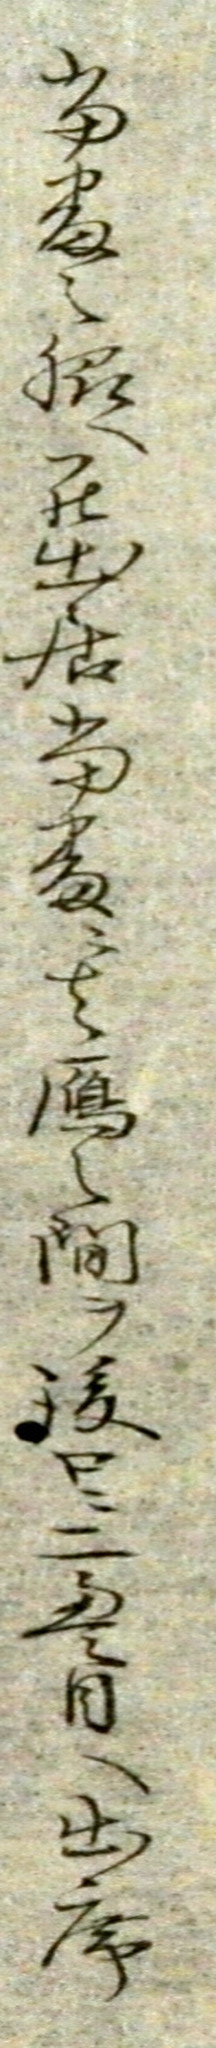当番之脇へ罷出居当番ニ者鴈之間ヲ後ロニ二畳目へ出席
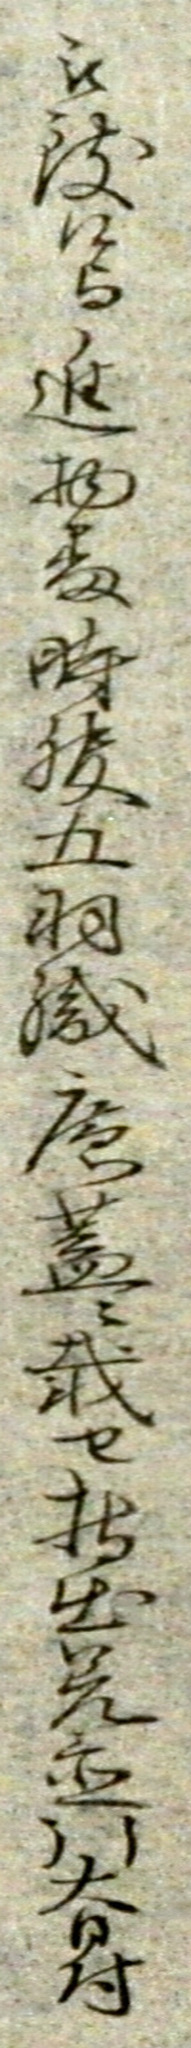被致候与進物番時服五羽織廣蓋ニ載セ持出差置引大目付
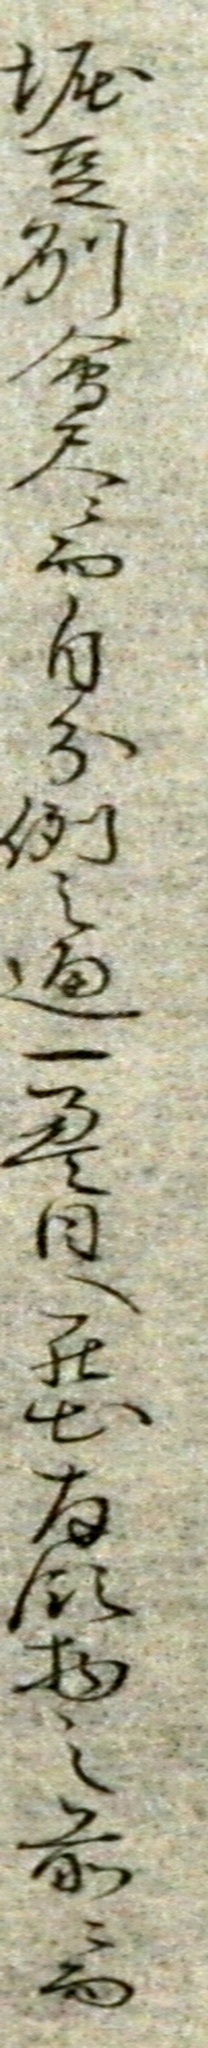堀豆州会釈ニ而自分例之通一畳目へ罷出拝領物之前ニ而

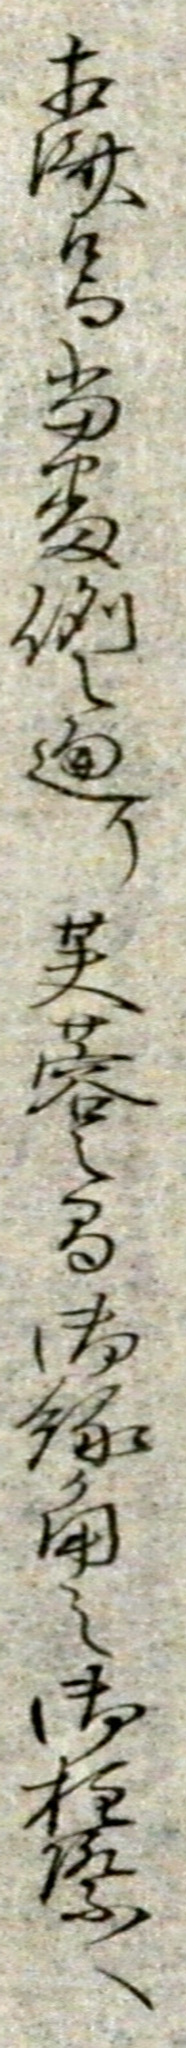相済候と当番例之通り芙蓉之間御縁角之御柱際へ
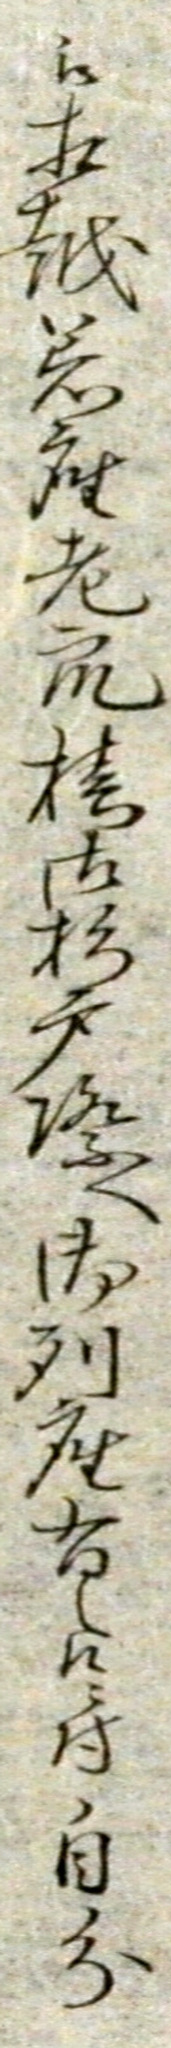被相越着座老衆横御杉戸際へ御列座有之候ニ付自分
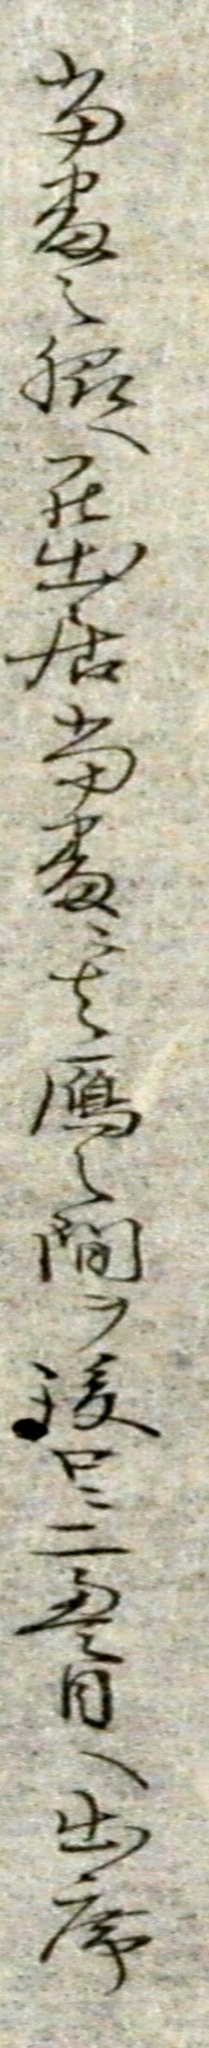当番之脇へ罷出居当番ニ者雁之間ヲ後口二畳目へ出席
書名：日光御名代相勤候節ノ留
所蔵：伊那市立高遠町図書館・合同会社AMANE
